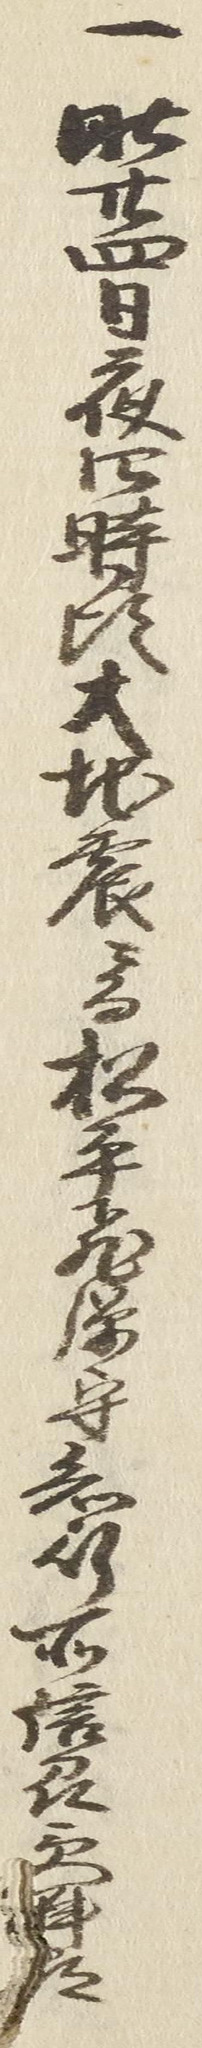一昨廿四日夜四時頃大地震二而松平飛騨守様知行所信州更級郡
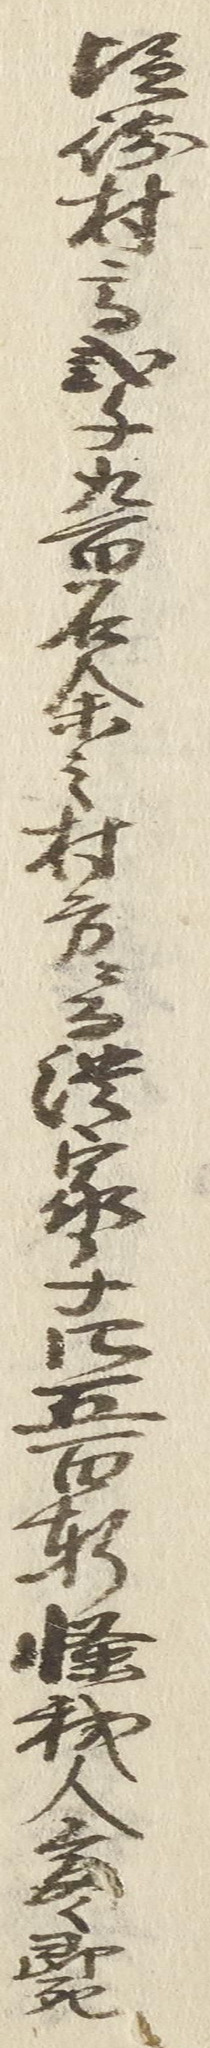塩崎村高弐千九百石余之村方二而潰家千四五百軒怪我人多く人数即死
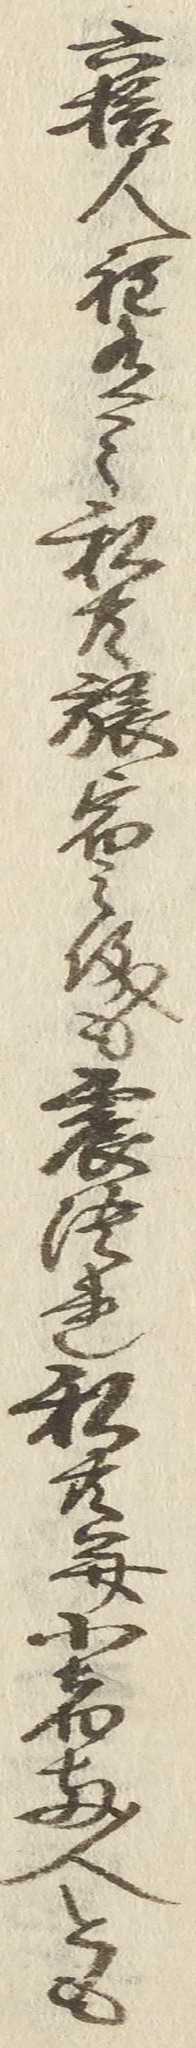六拾人程有之私共旅宿之儀も震潰れ私共并小者両人とも
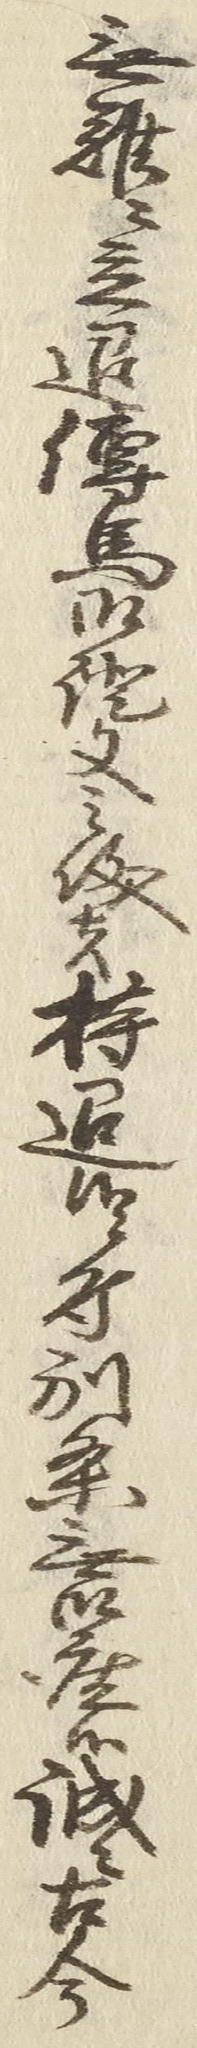無難二立退伝馬御證文之義は持退候二付別條無御座候誠二古今
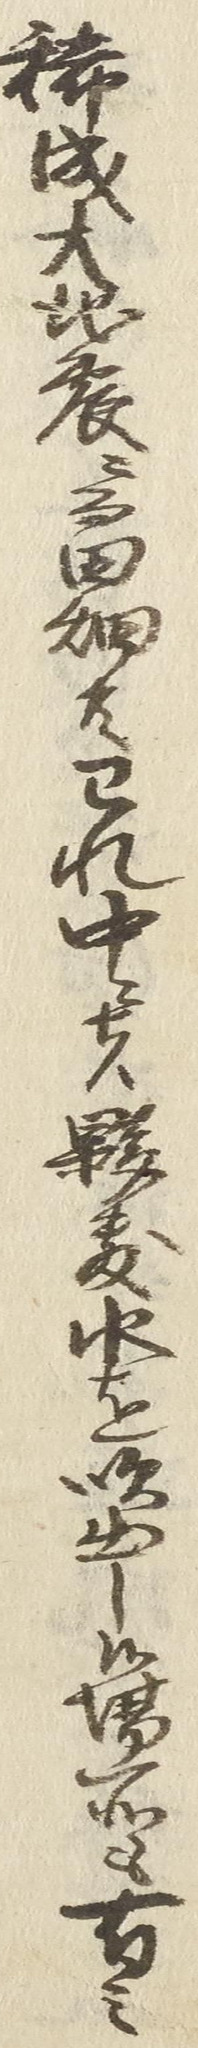稀成大地震二而田畑共われ中二ハ夥敷水を吹出し候場所も有之
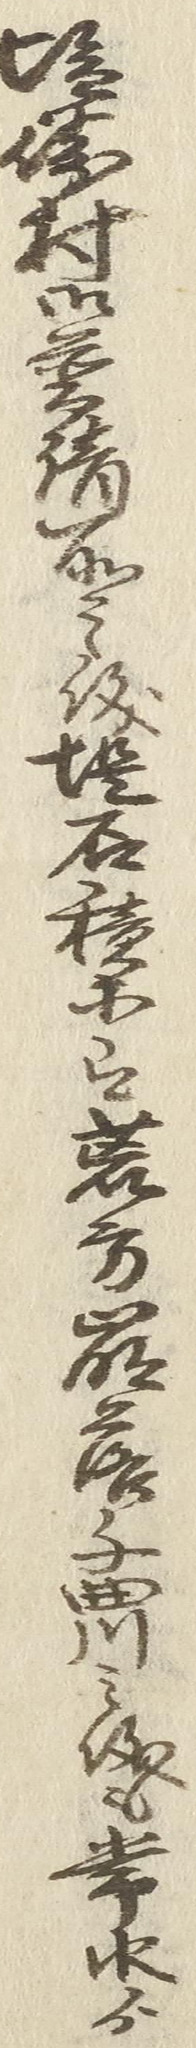塩崎村御普請所之儀堤石積等は荒方崩落千曲川之儀も常水ゟ
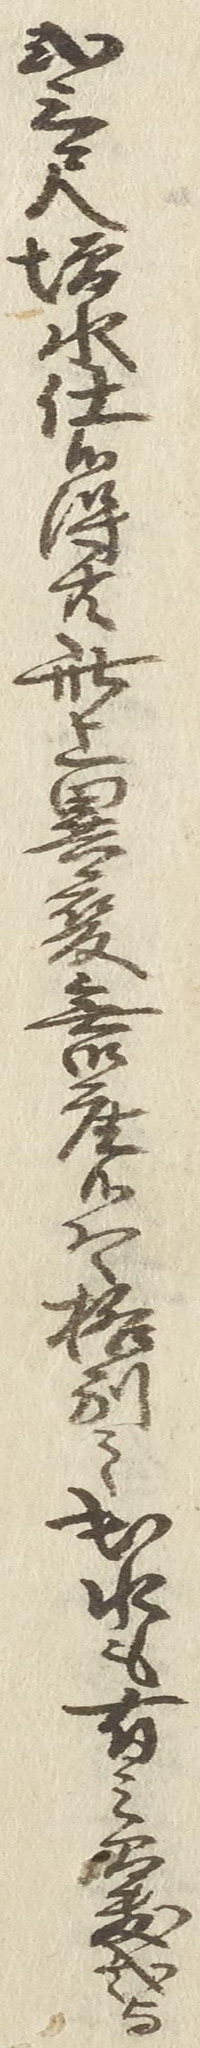弐三丈増水仕候得共私共此上異変無御座候は格別之出水も有之間敷哉と
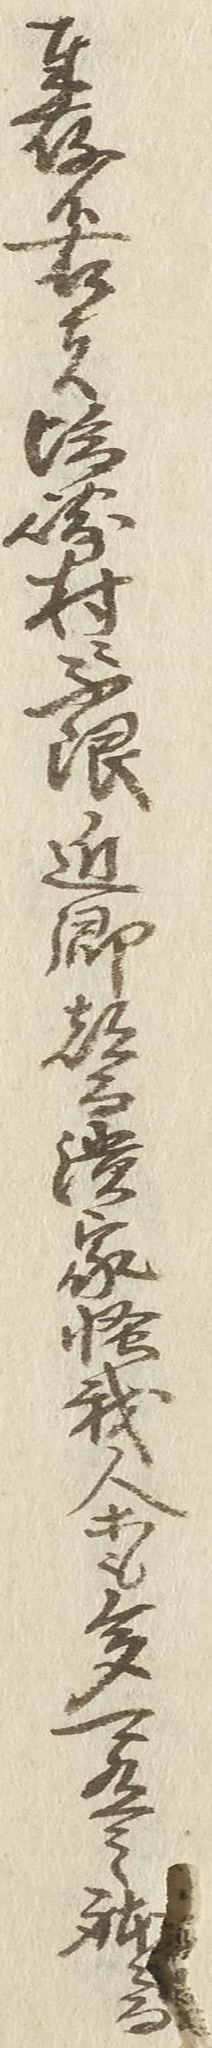奉存候右は塩崎村二不限近郷都而潰家怪我人等も多可有之躰二而
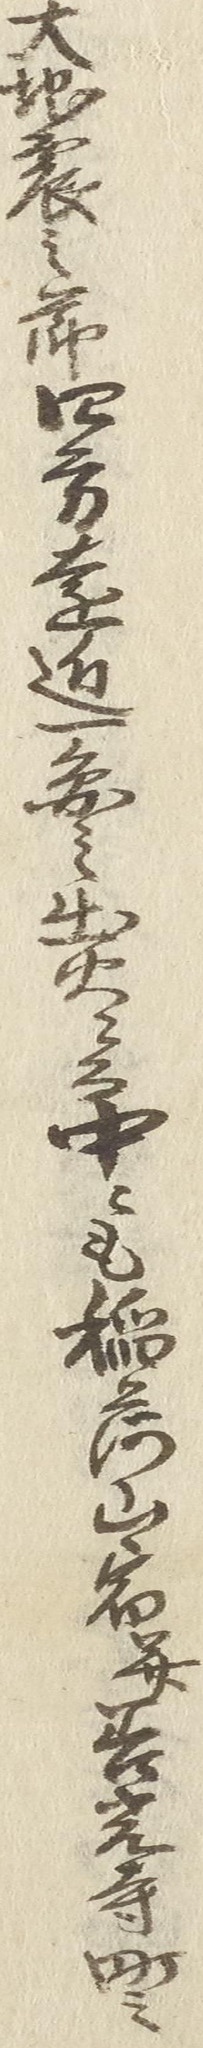大地震之節四方遠近一円之出火二而中二も稲荷山宿并善光寺町之
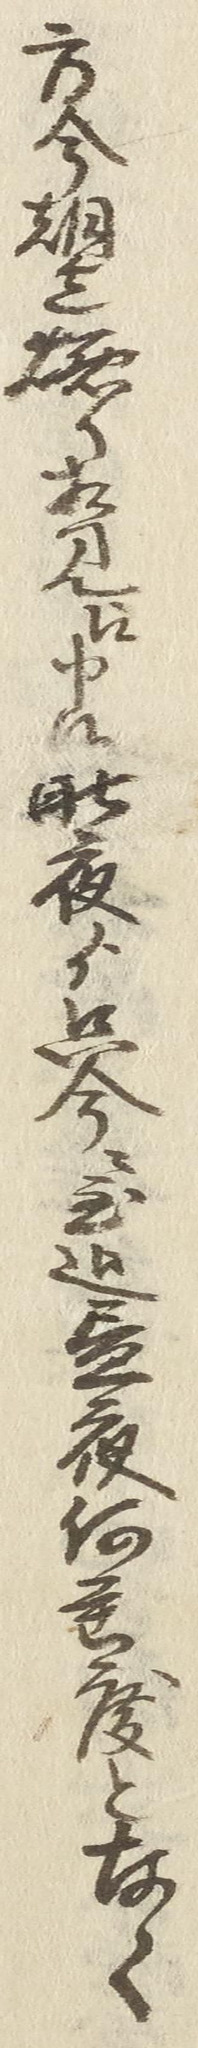方今今朝迄煙り相見江申候昨夜ゟ只今二至迄昼夜何重度となく
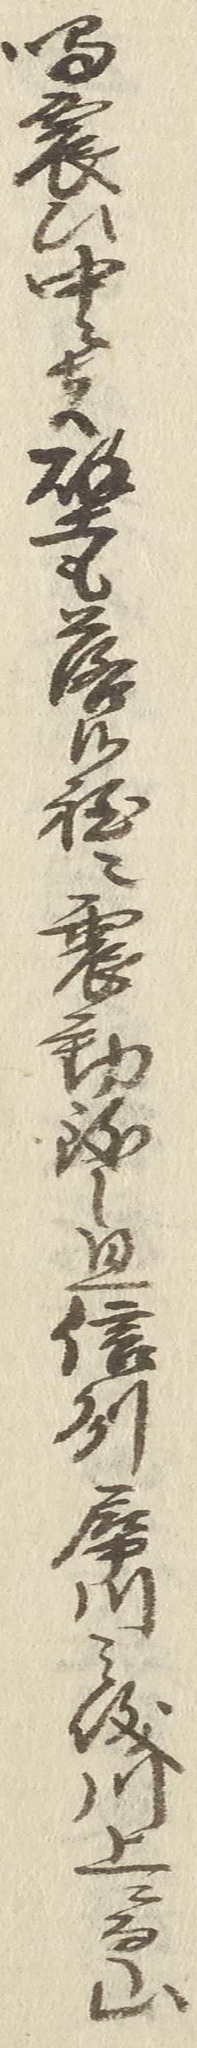鳴震ひ中には壁も落候程二震動いたし且信州犀川之義儀川上ゟ二而山
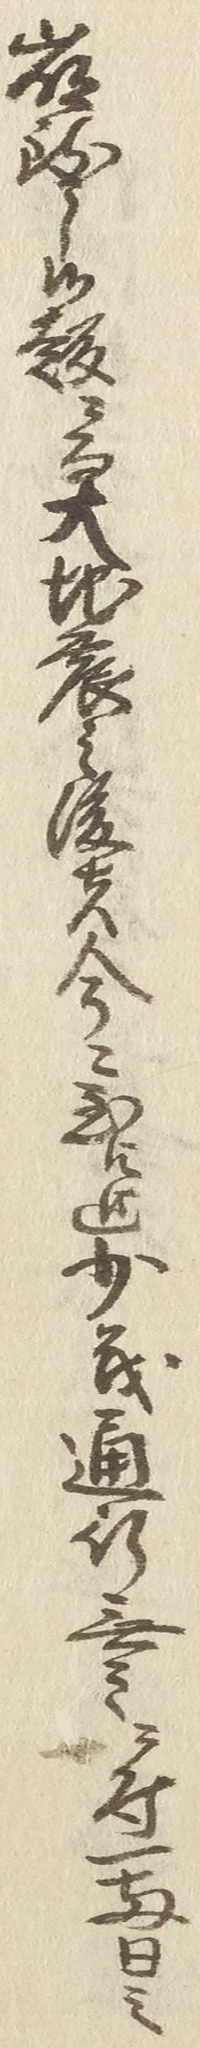崩致し候趣二而大地震之後は今に至江迄少も通行無之候二付一両日之
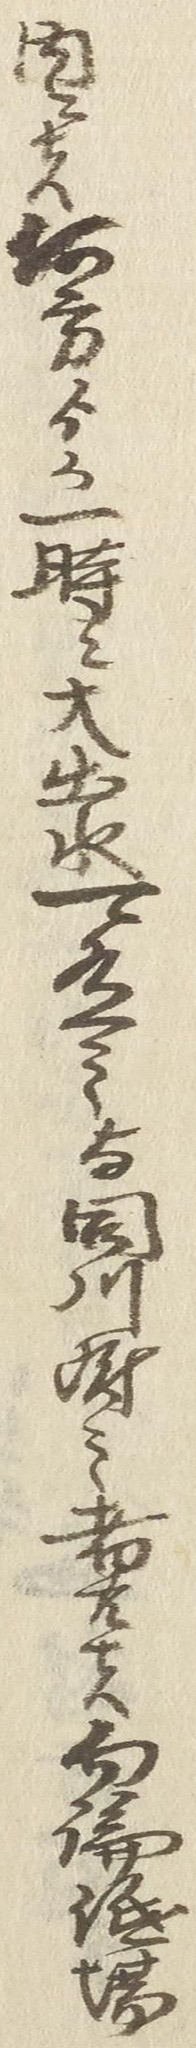内二は何方ゟ一時二大出水可有と同川附ハ者共は勿論低場
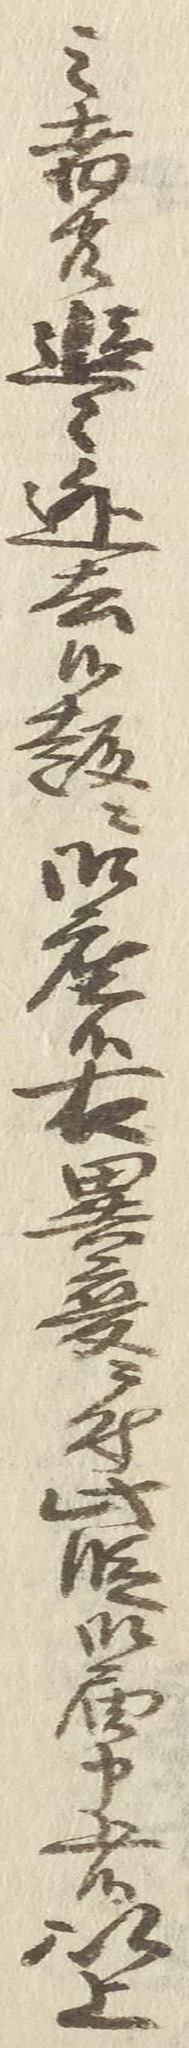之者共追々逃去候趣二御座候右異変二付此段御届申上候以上

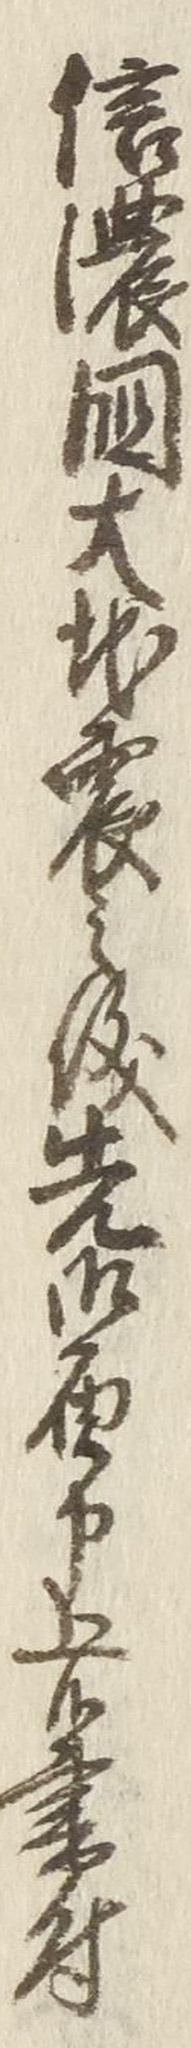信濃国大地震之儀先温届申上候書付
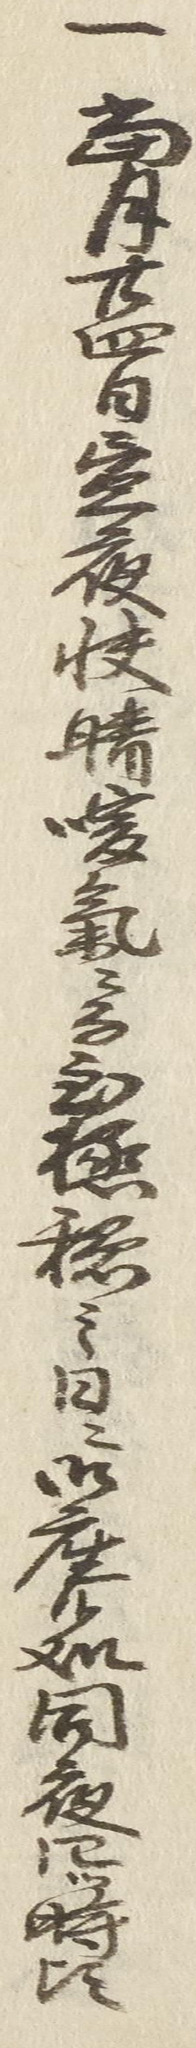一当月廿四日昼夜快晴暖気二而至極穏之日二御座候処同夜四ッ時頃
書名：従往古地震御届書記誌之一
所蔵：東京大学地震研究所図書室 Earthquake Research Institute Library, The University of Tokyo, JAPAN
